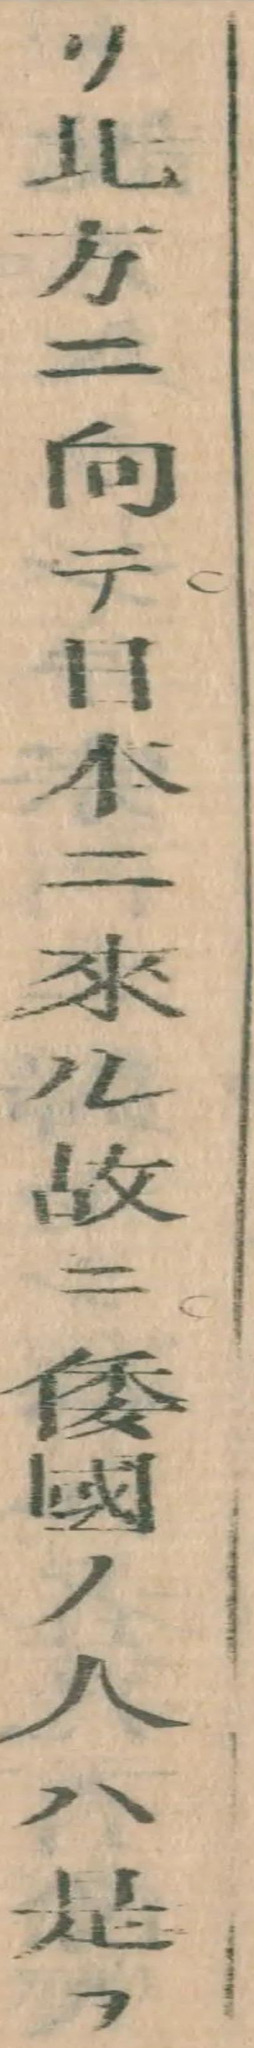リ北方ニ向テ。日本ニ来ル故ニ。倭国ノ人ハ是ヲ
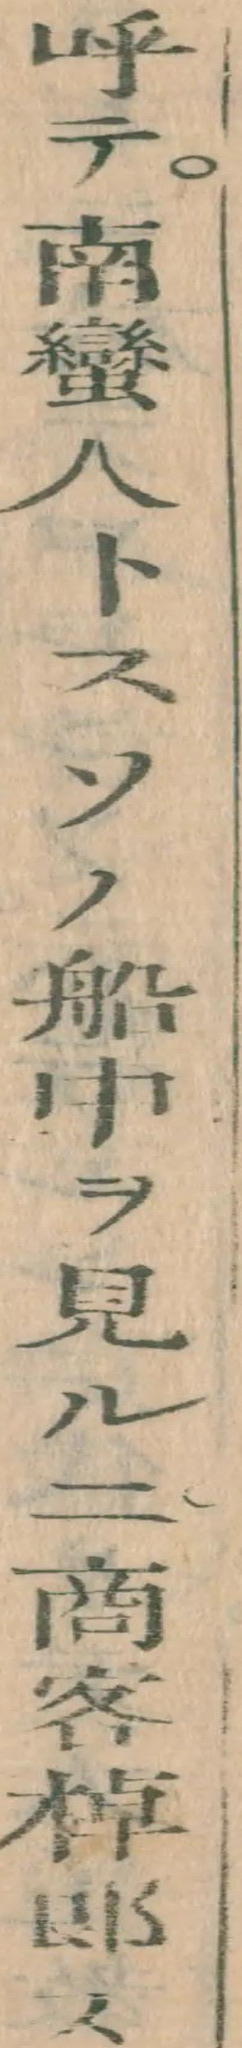呼テ。南蛮人トスソノ船中ヲ見ルニ。商客棹郎ス
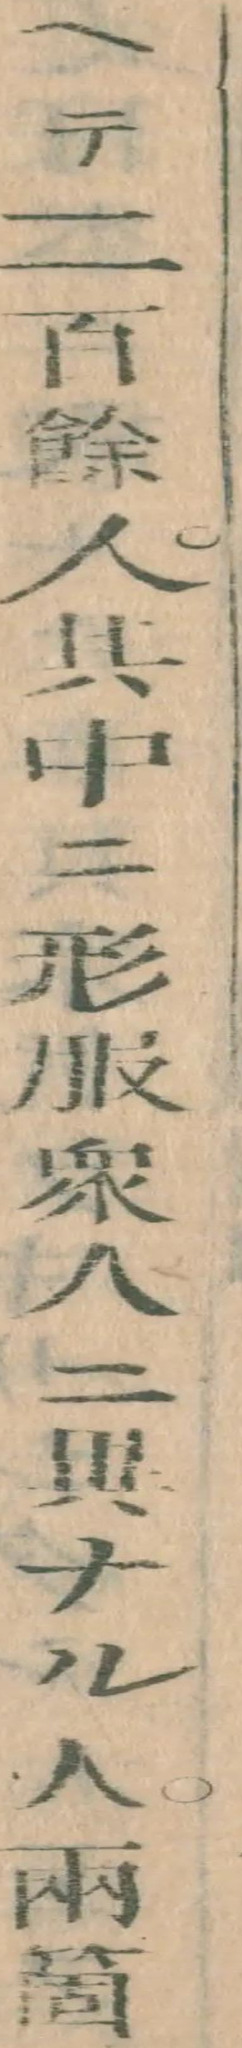ヘテ二百余人。其中ニ形服衆人ニ異ナル人。両箇
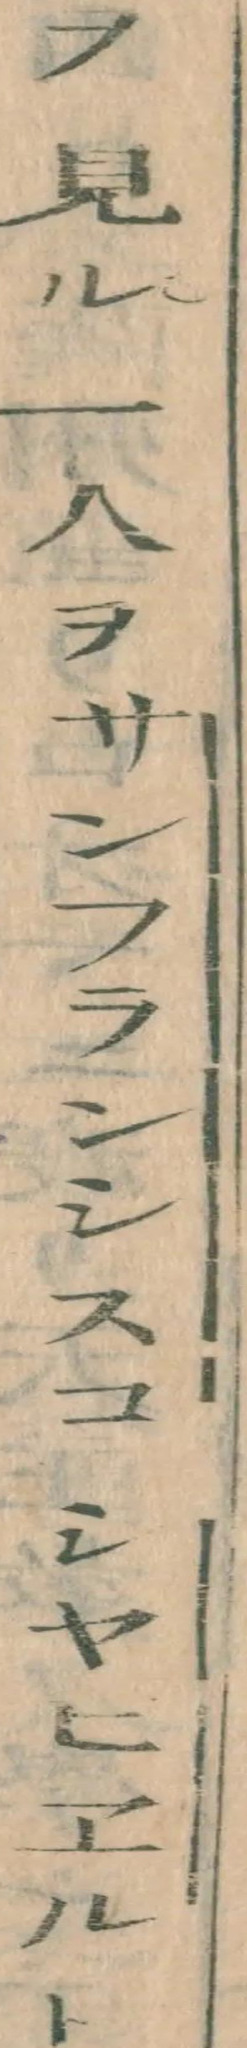ヲ見ル。一人ヲサンフランシスコシヤヒヱルト
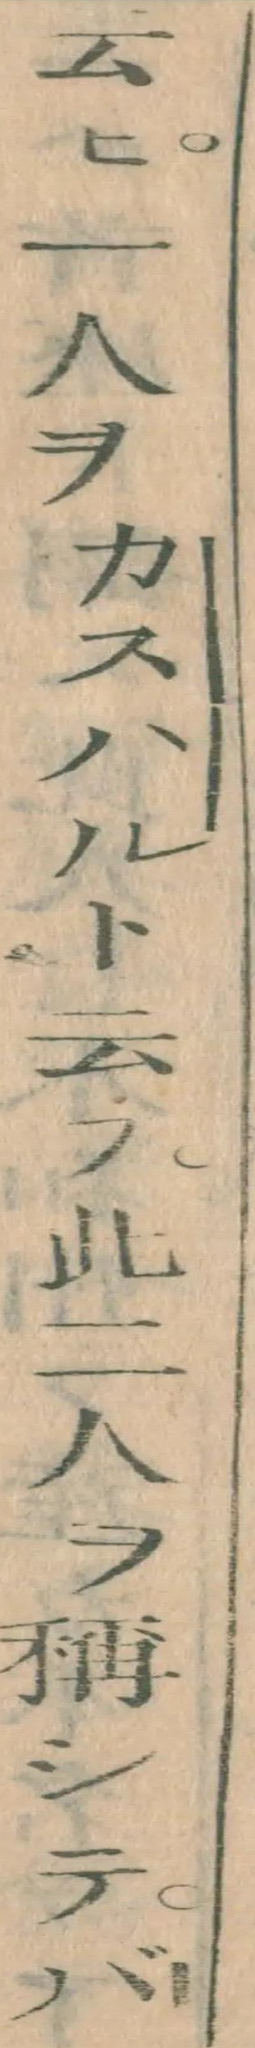云ヒ。一人ヲカスハルト云フ。此二人ヲ称シテ。バ
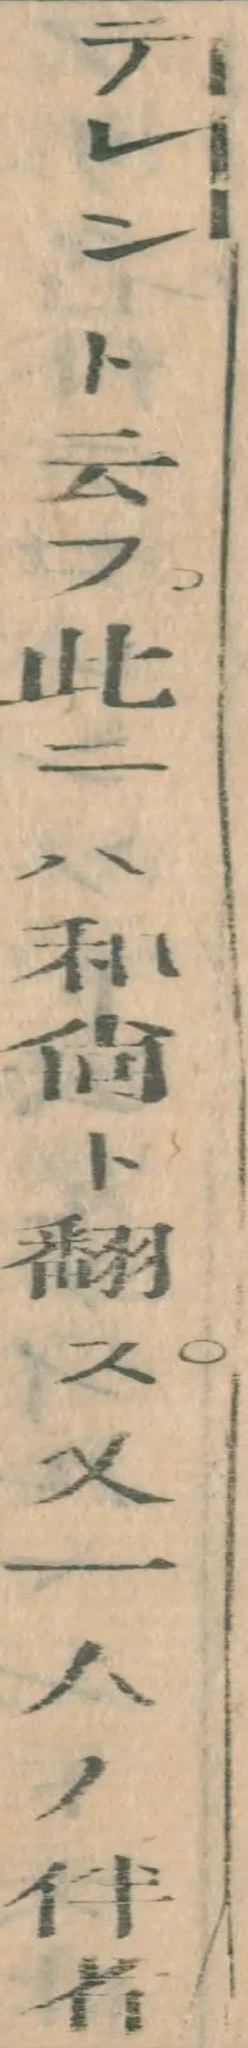テレント云フ。此ニハ和尚ト翻ス。又一人ノ伴者

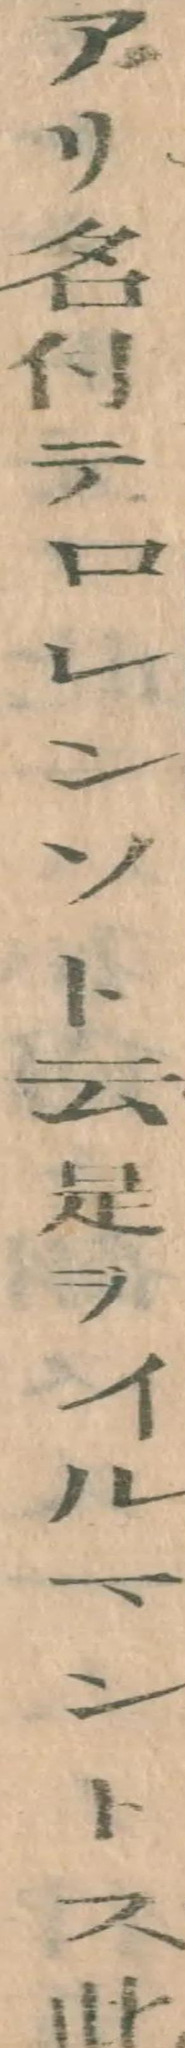アリ名付テロレンソト云。是ヲイルマントス。此
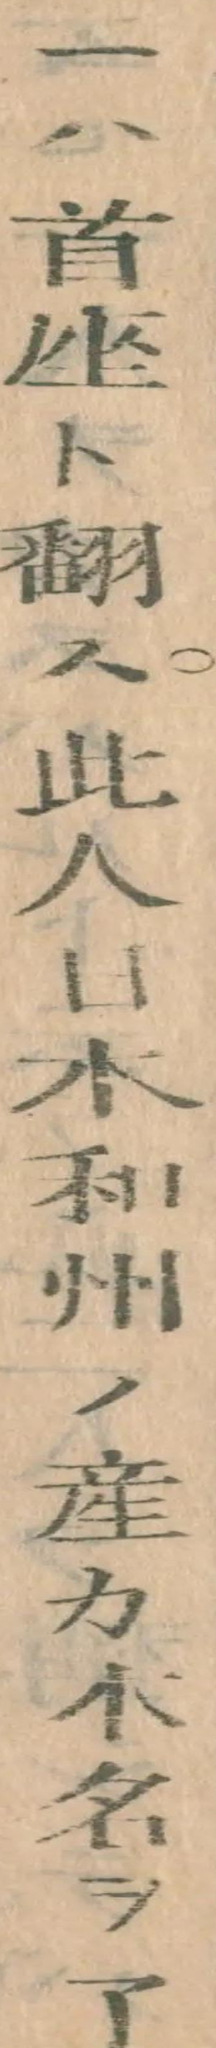ニハ首座ト翻ス。此人日本和州ノ産カ本名ヲ了
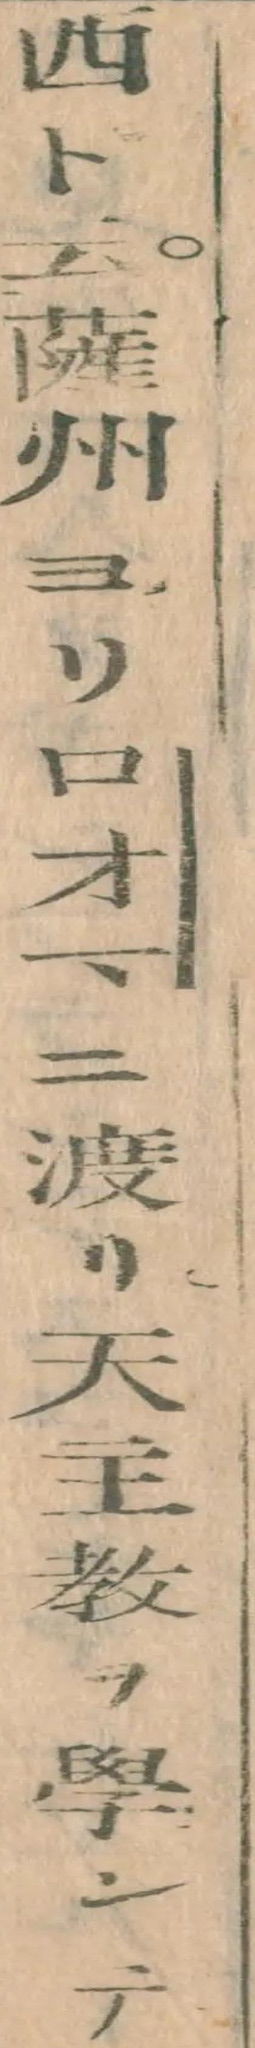西ト云。薩州ヨリロオマニ渡リ。天主教ヲ学ンテ
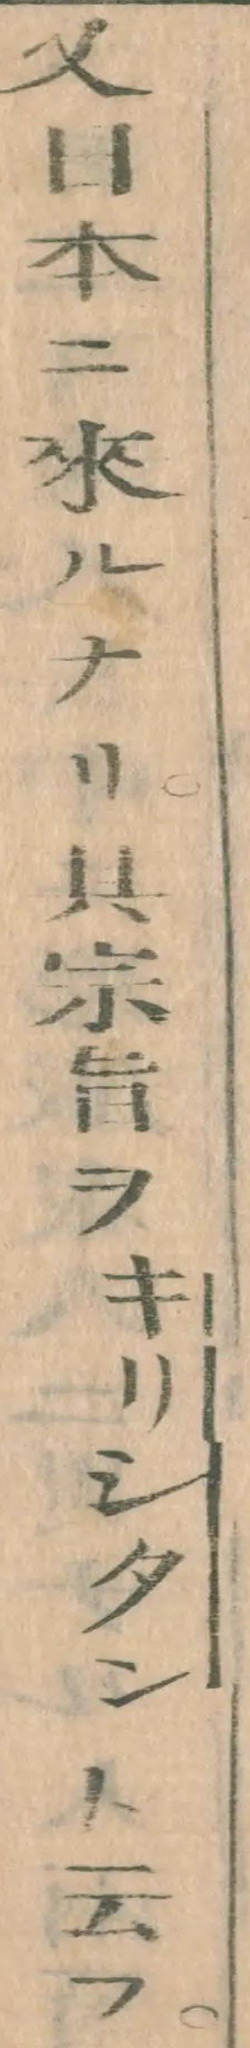又日本ニ来ルナリ。其宗旨ヲキリシタント云フ。
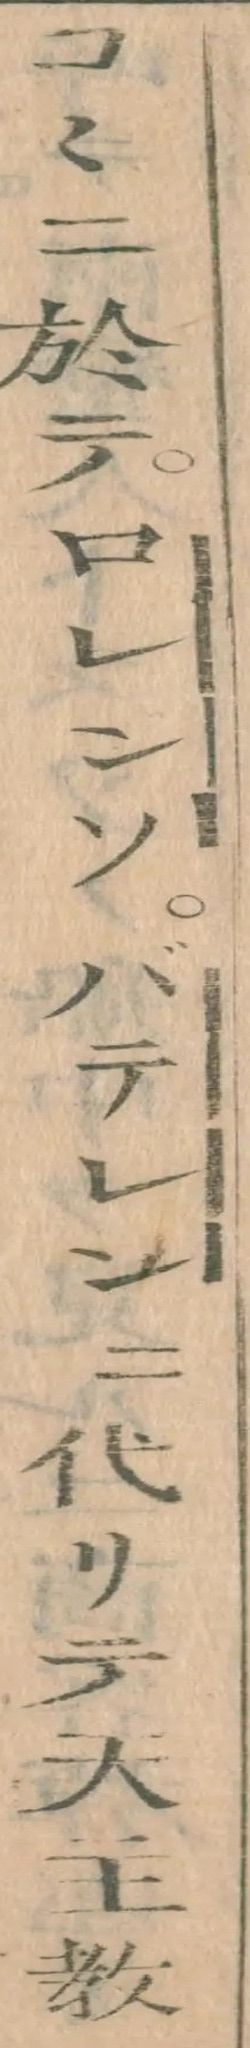コ〱ニ於テ。ロレンソ。バテレンニ代リテ天主教
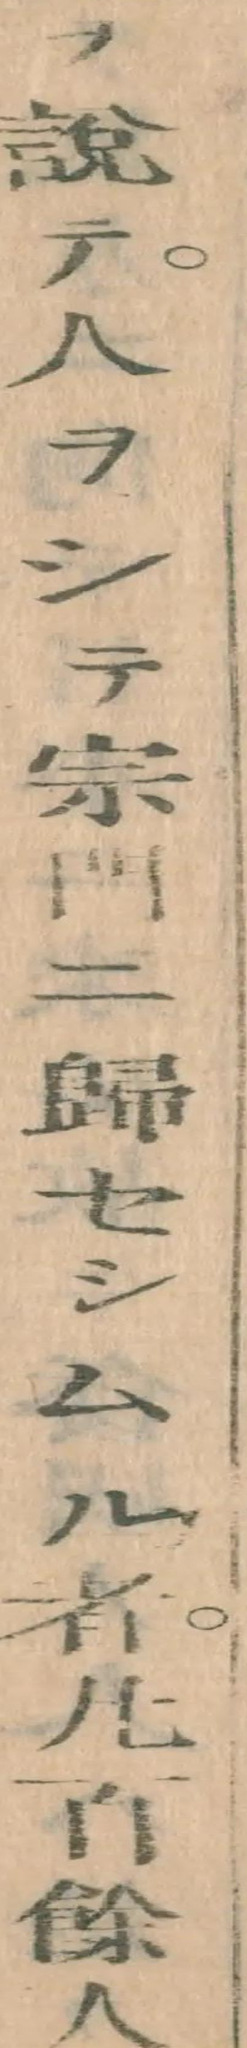ヲ説テ。人ヲシテ宗門ニ帰セシムル者。凡百余人
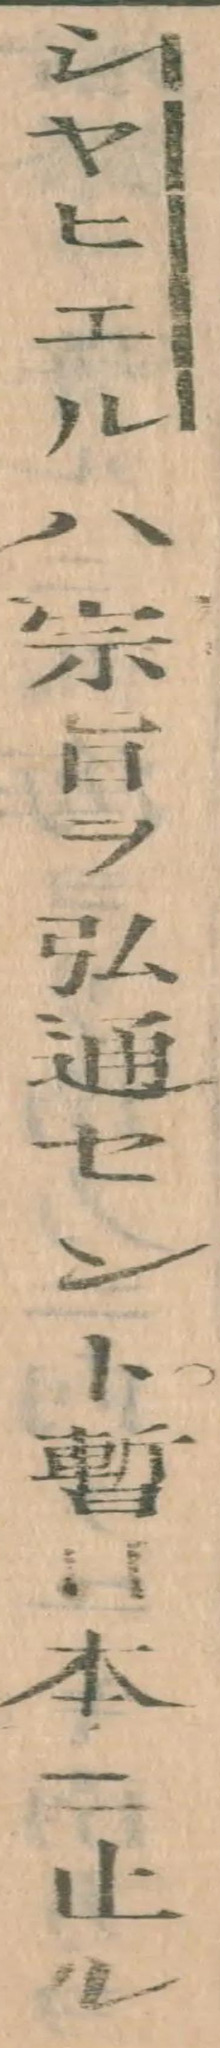シヤヒエルハ宗旨ヲ弘通セント。暫日本ニ止ル
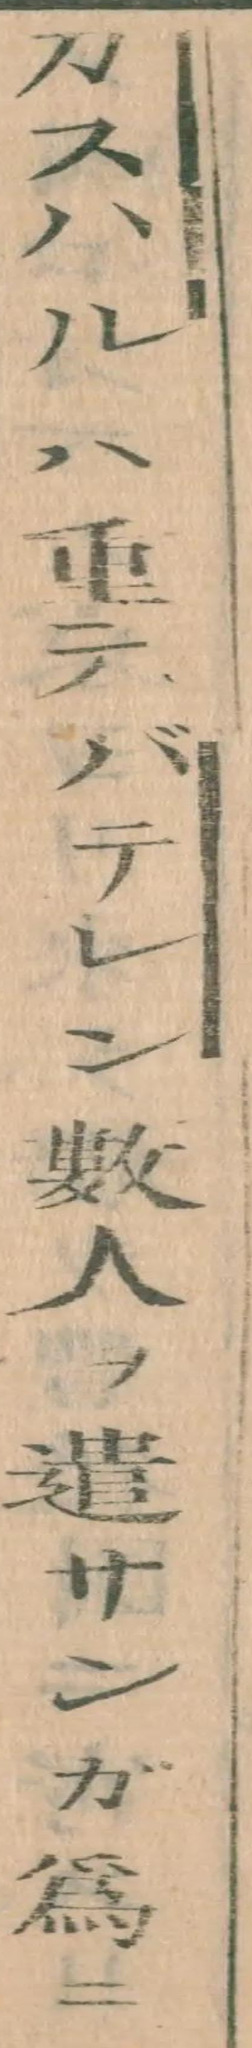カスハルハ重テバテレン数人ヲ遣サンガ為ニ
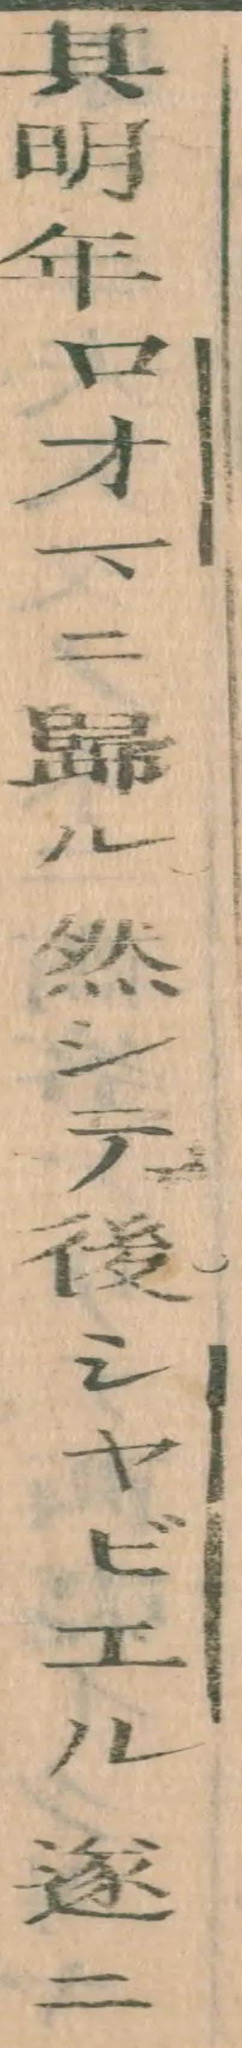其明年ロオマニ帰ル然シテ後。シヤビエル遂ニ
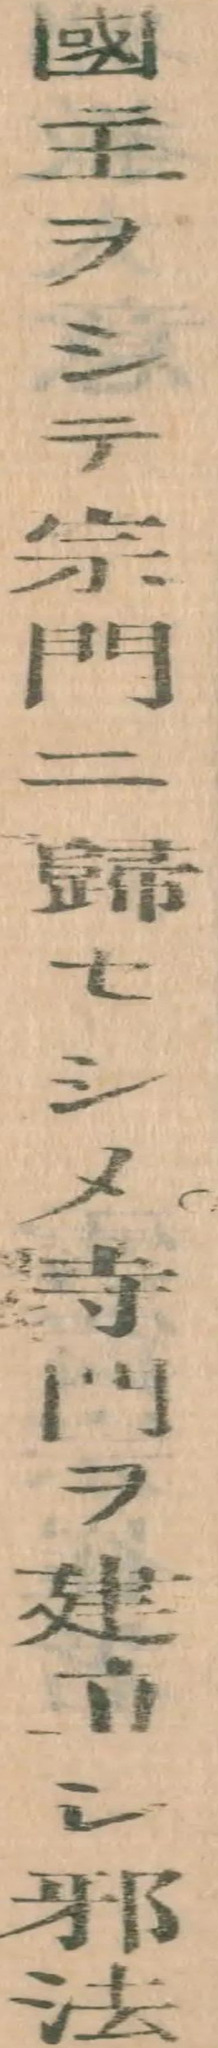国主ヲシテ宗門ニ帰セシメ寺門ヲ建立シ邪法
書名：南蛮寺興廃記
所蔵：国立国会図書館 National Diet Library, JAPAN
